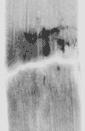{廿八}
